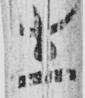生
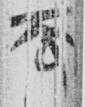而
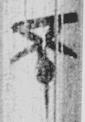不
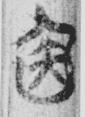因
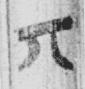亓
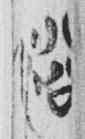浴（俗）
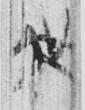吳
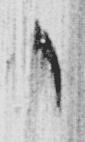人
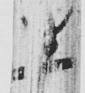生
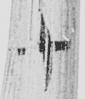七
